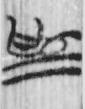爲
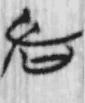左
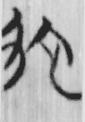{力它}
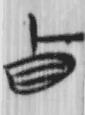貞
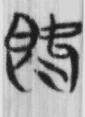既
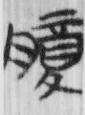腹
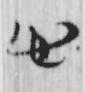心
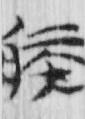疾
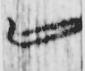㠯（以）
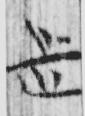上B
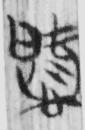○（氣）
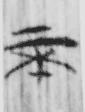不
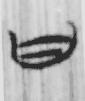甘
